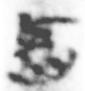○（牙）
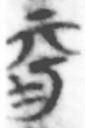坪
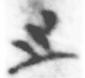之
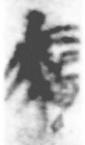爲
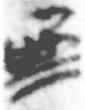爲
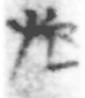○（左）
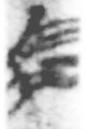驂
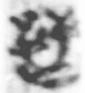晉
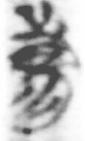○（陽）
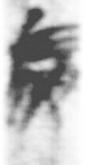駁
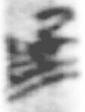爲
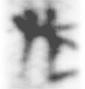○（左）
